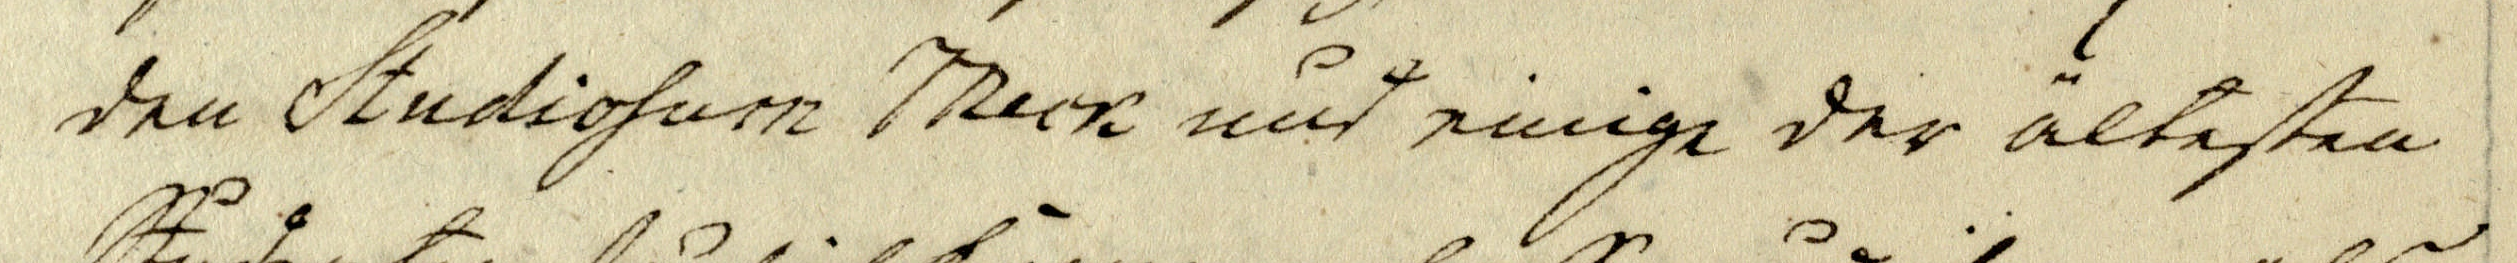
den Studiosum Meck und einige der ältesten
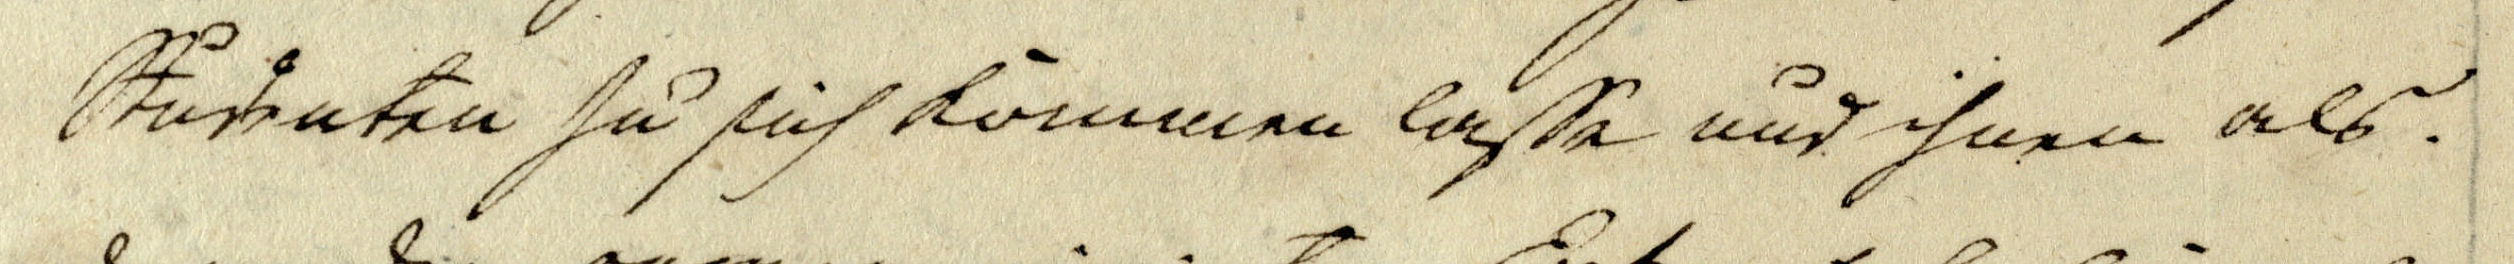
Studenten zu sich kommen lasse und ihnen als¬
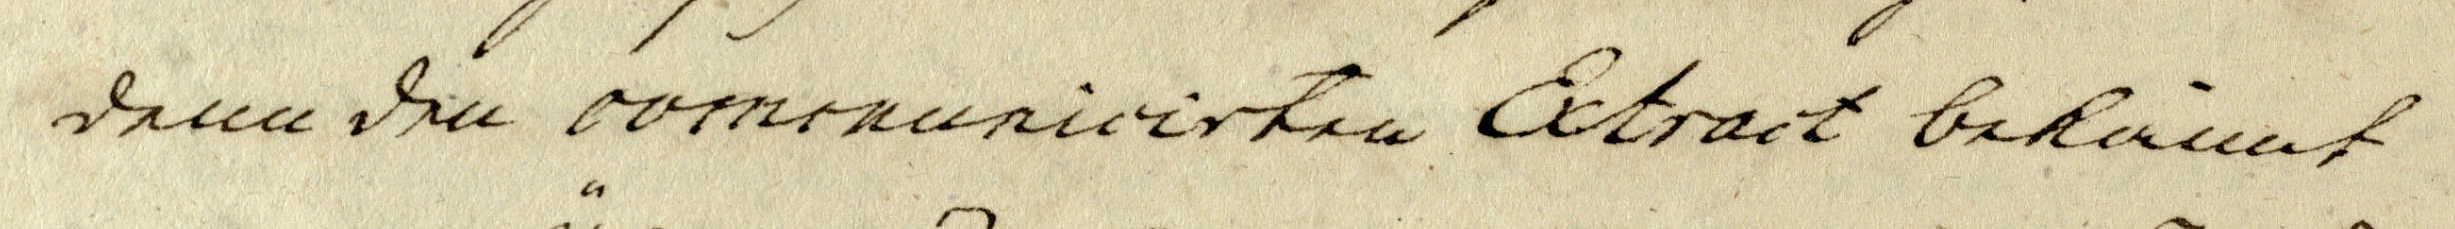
denn den communicirten Extract bekannt
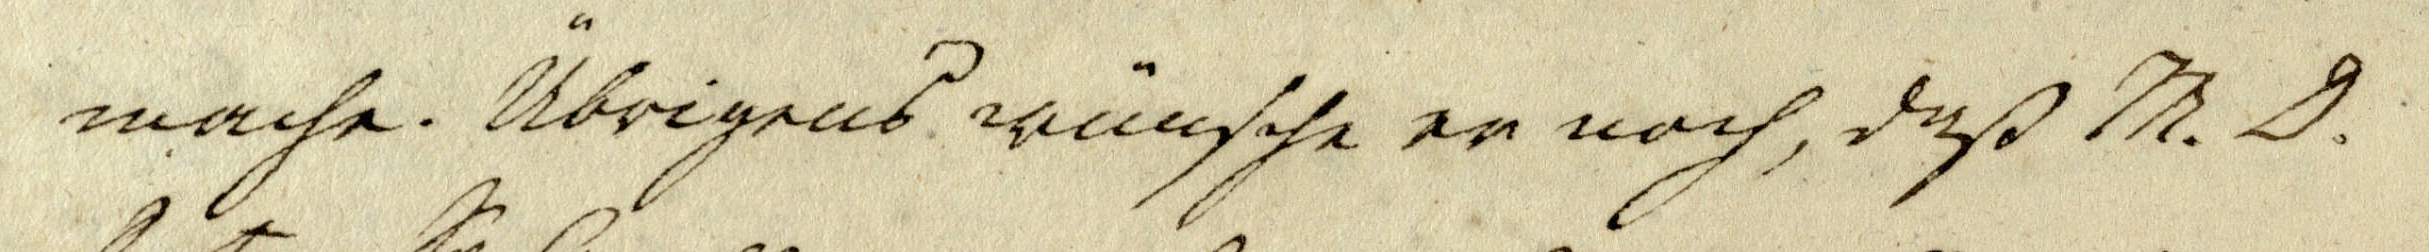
mache. Übrigens wünsche er noch, daß M. D.
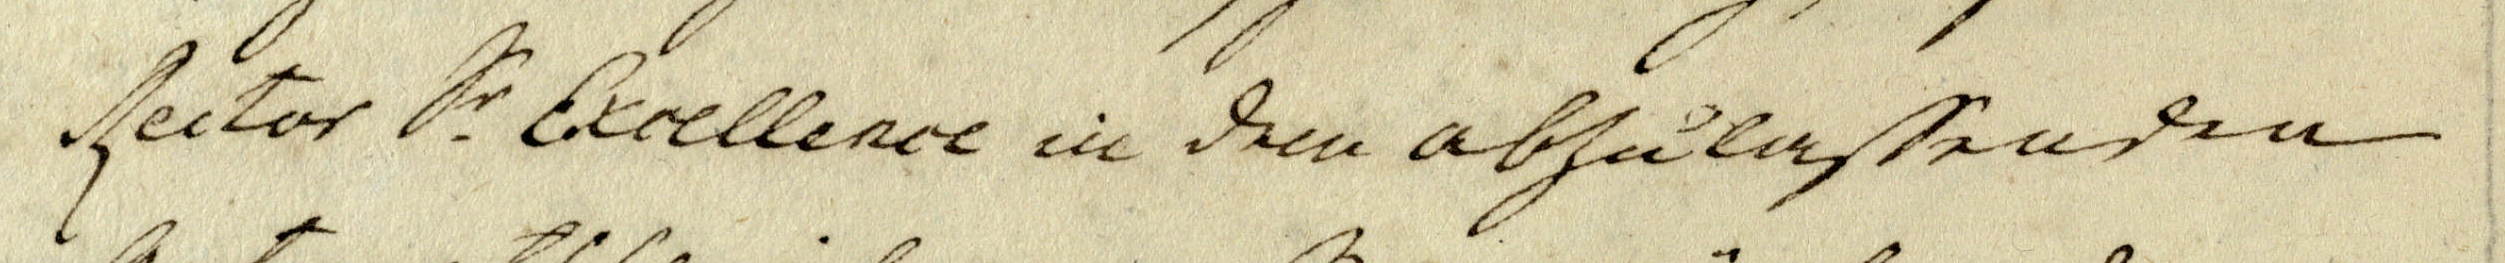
Rector Sr Excellence in dem abzulassenden
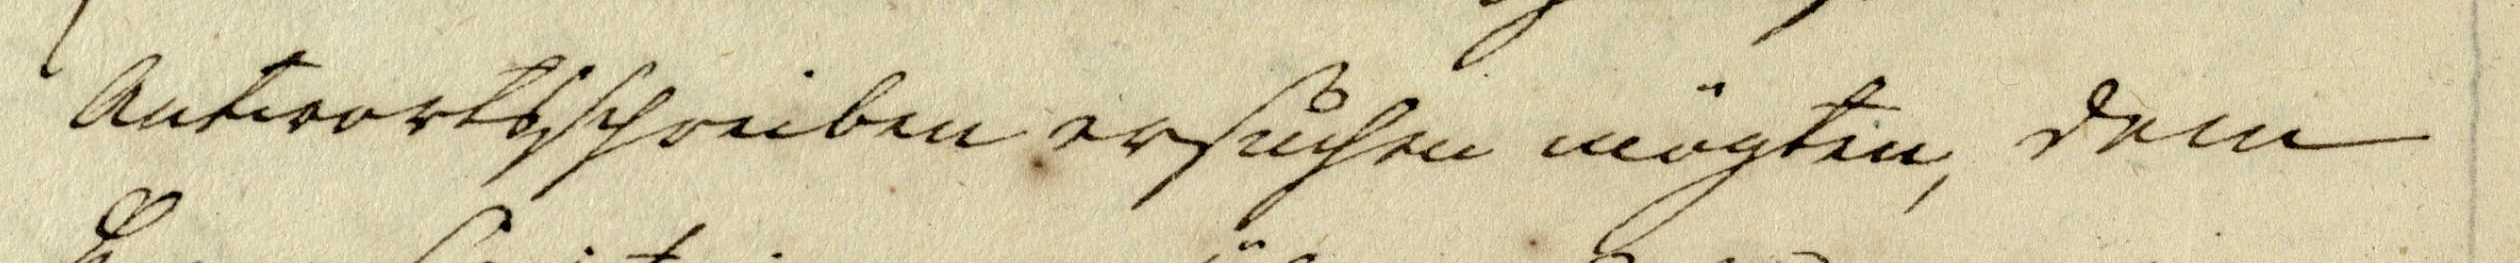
Antwortsschreiben ersuchen mögten, dem
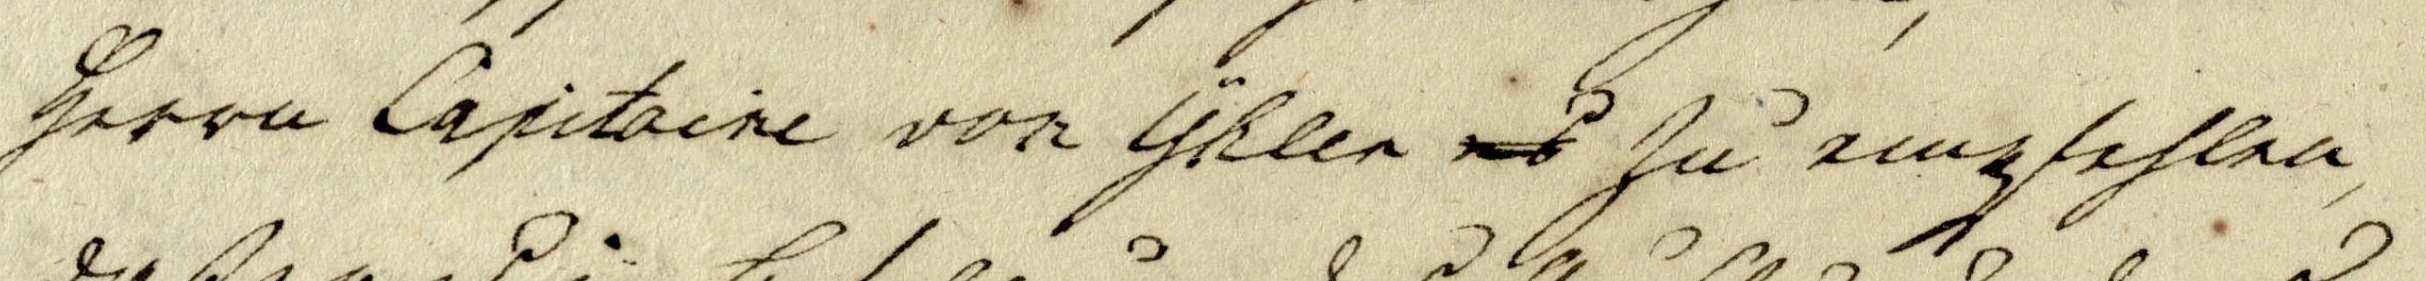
Herrn Capctaine von Ÿhlen es zu empfehlen,
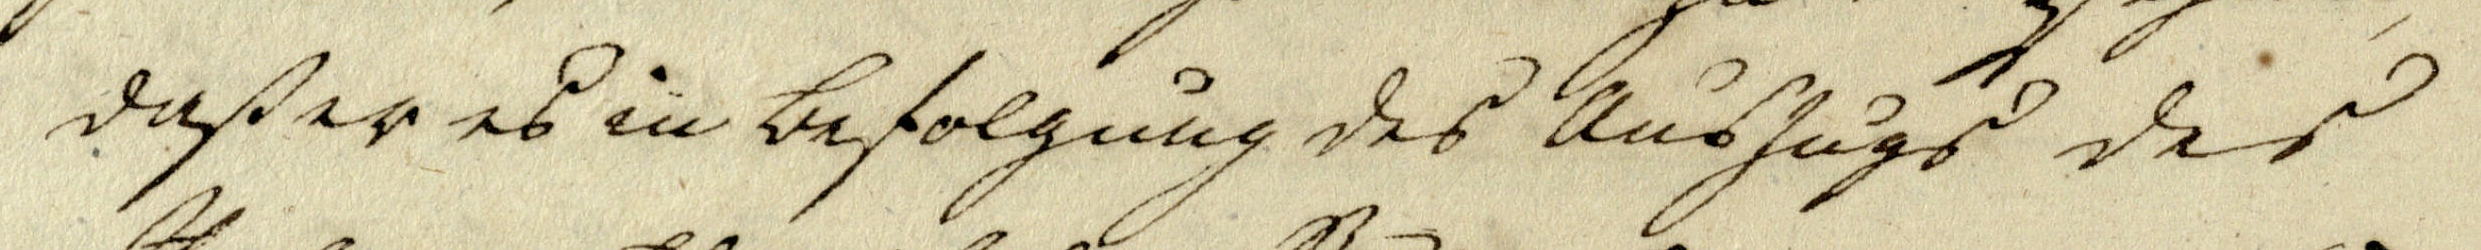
daß er es in Befolgung des Auszugs des
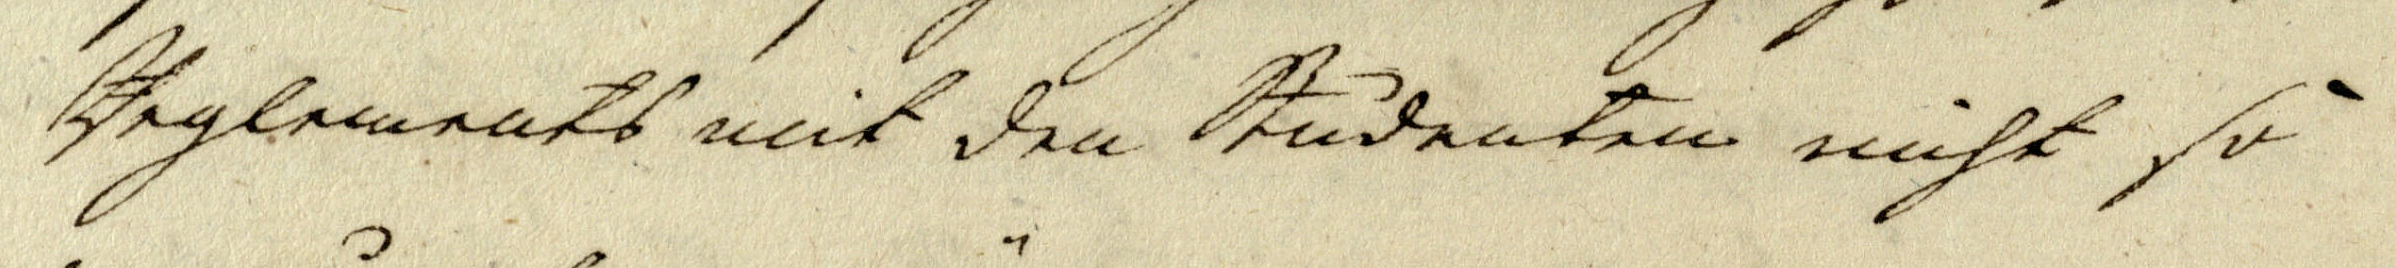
Reglements mit den Studenten nicht so
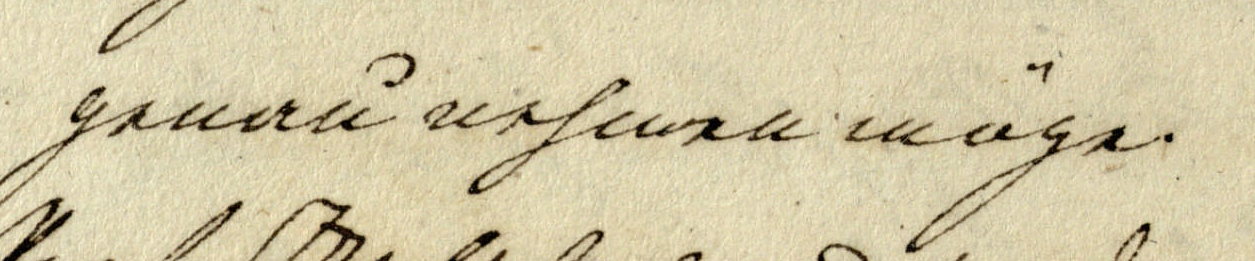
genau nehmen möge.
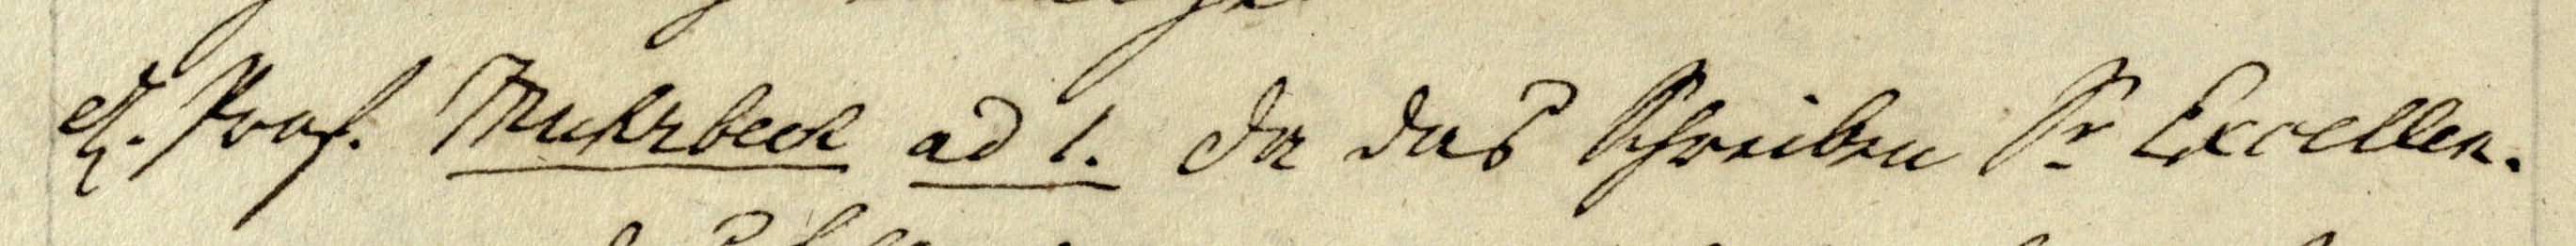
dh. Prof. Muhrbeck ad 1. Da das Schreiben Sr Excellen¬
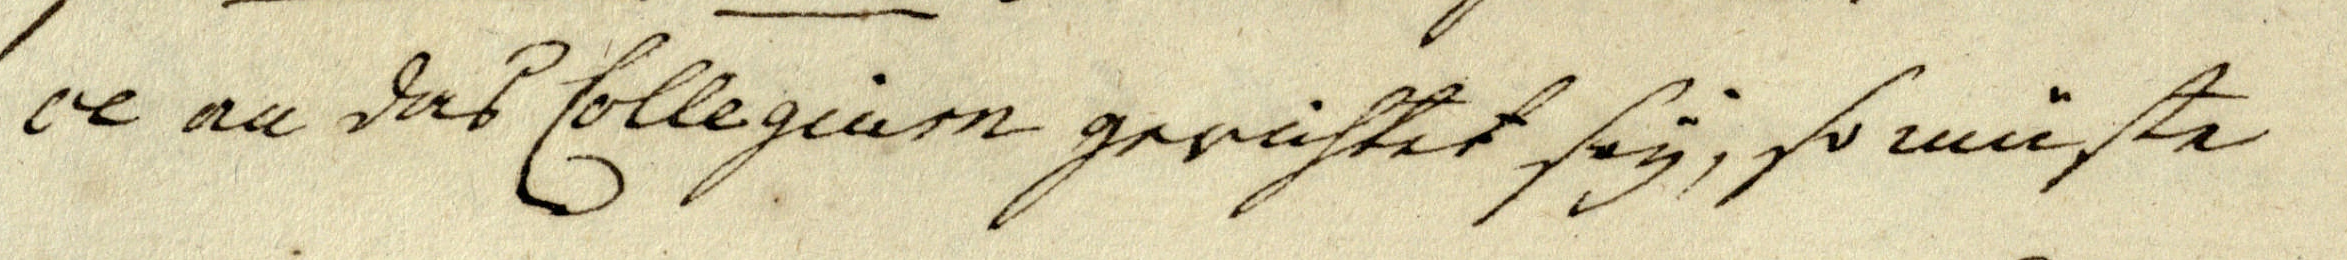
ce an das Collegium gerichtet seÿ, so müßte
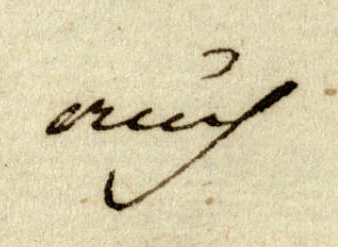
auch
